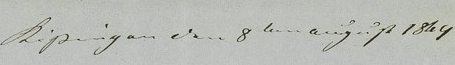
Kißingen den 8ten August 1849
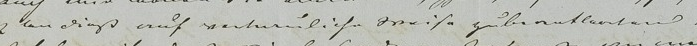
2ten dieß auf vertrauliche Weise zu beantworten.
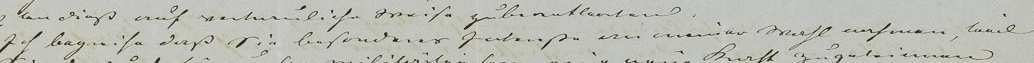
Ich begreife daß Sie besonderes Intereße an meiner Wahl nahmen, weil
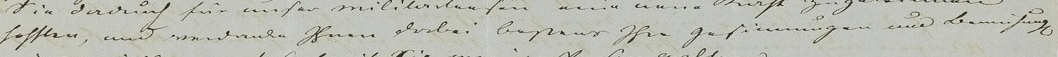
hofften, und verdanke Ihnen dabei bestens Ihre Gesinnungen und Bemühungen
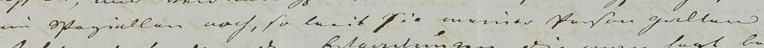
im Speziellen noch, so weit sie meiner Person galten.
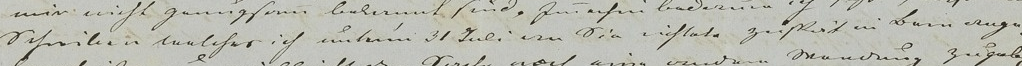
Schreiben welches ich unter'm 31 Juli an Sie richtete zu spät in Bern ange-
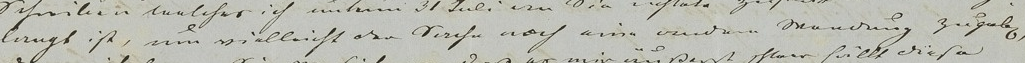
langt ist, um vielleicht der Sache noch eine andere Wendung zu geben,
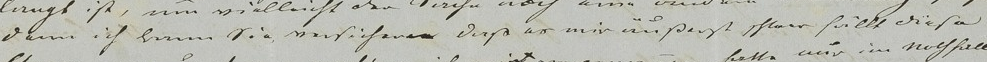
denn ich kann Sie versichern, daß es mir äußerst schwer fällt diese
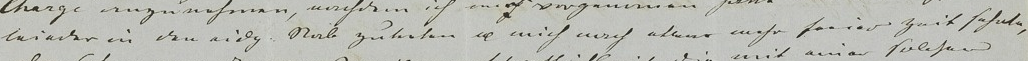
wieder in den eidg. Stab zutreten & mich nach etwas mehr freier Zeit sehnte;
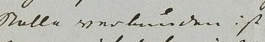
Rolle verbunden ist.
